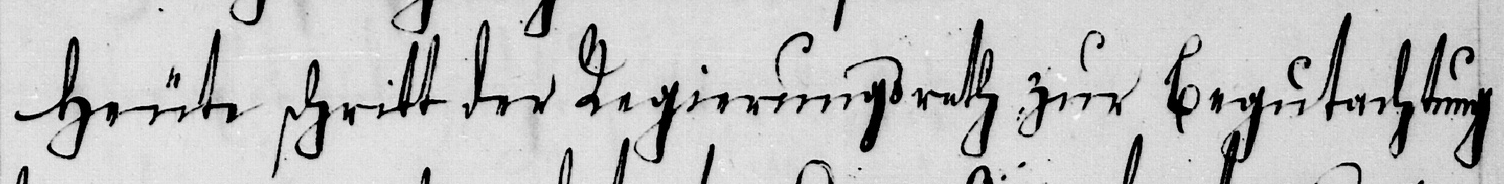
Heute schritt der Regierungsrath zur Begutachtung
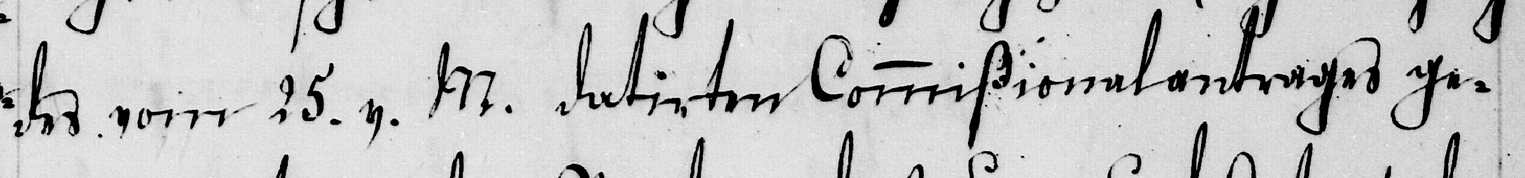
des vom 25. v. M. datirten Commißionalantrages ge¬
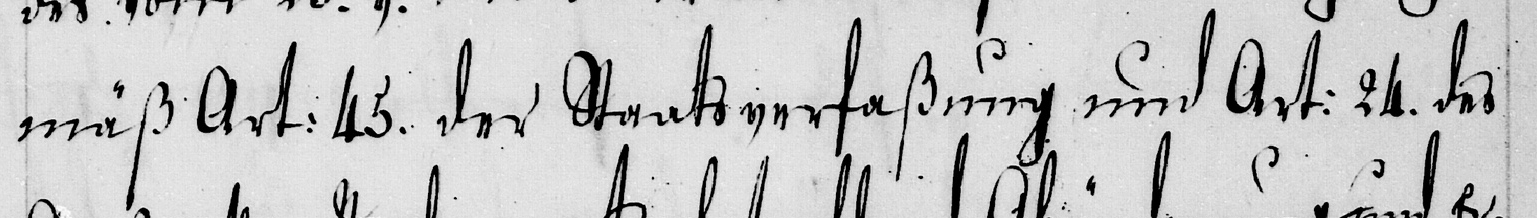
mäß Art: 45. der Staatsverfaßung und Art: 24. des
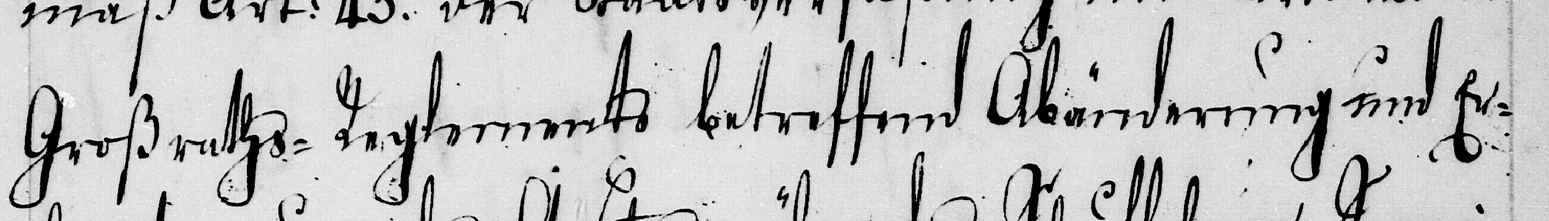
Großrathes-Reglements betreffend Abänderung und Er¬
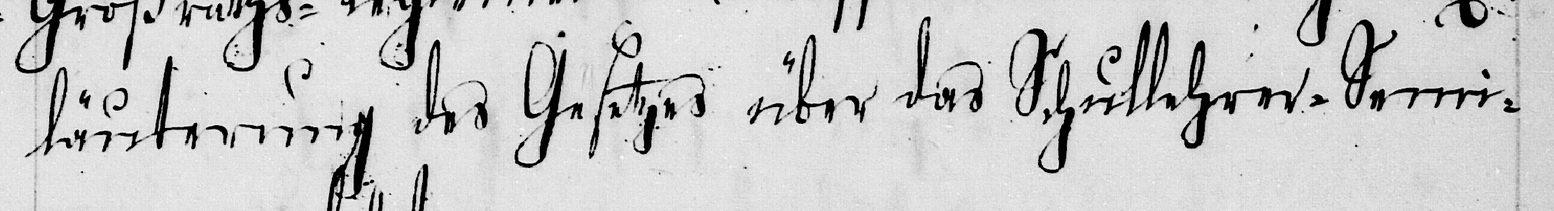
läuterung des Gesetzes über das Schullehrer-Semi¬
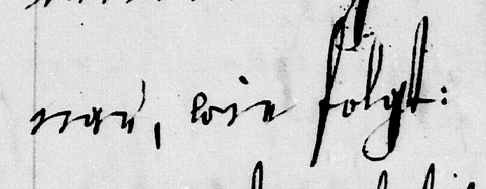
nar, wie folgt:
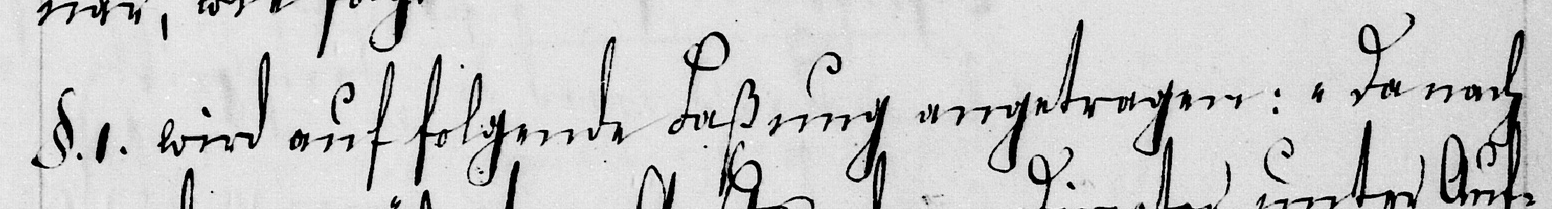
§. 1. wird auf folgende Faßung angetragen: „Da nach
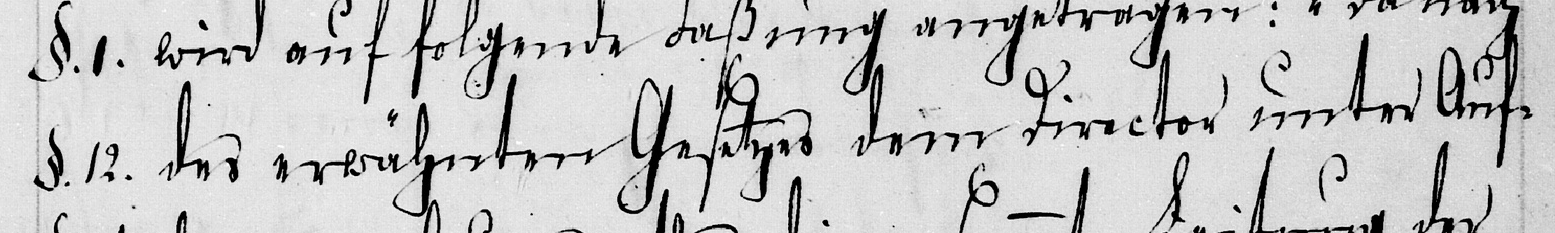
§. 12. des erwähnten Gesetzes dem Director unter Auf¬
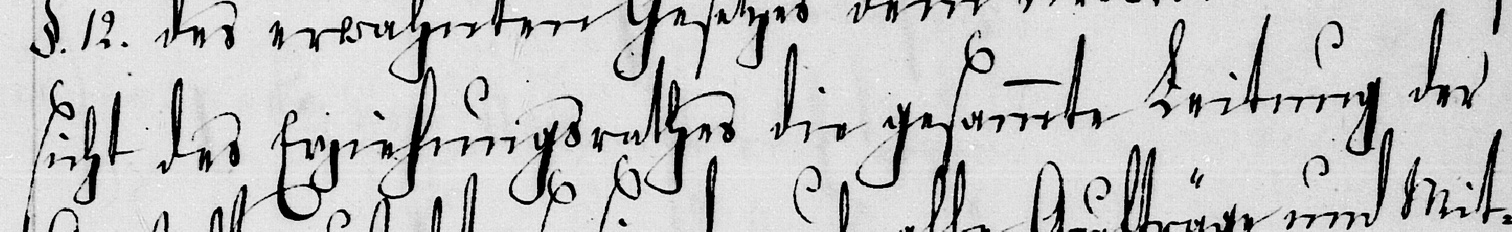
sicht des Erziehungsrathes die gesammte Leitung der
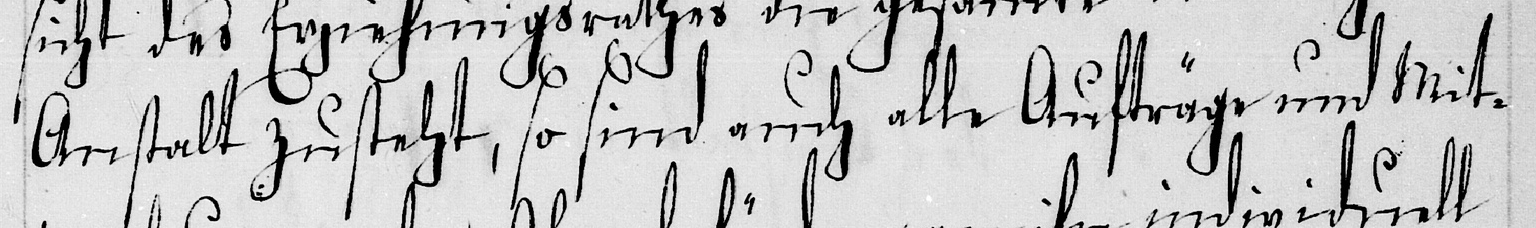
Anstalt zusteht, so sind auch alle Aufträge und Mit¬
